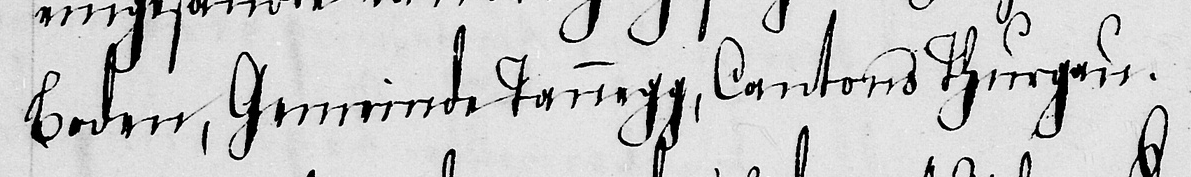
Boden, Gemeinde Tannegg, Cantons Thurgau.
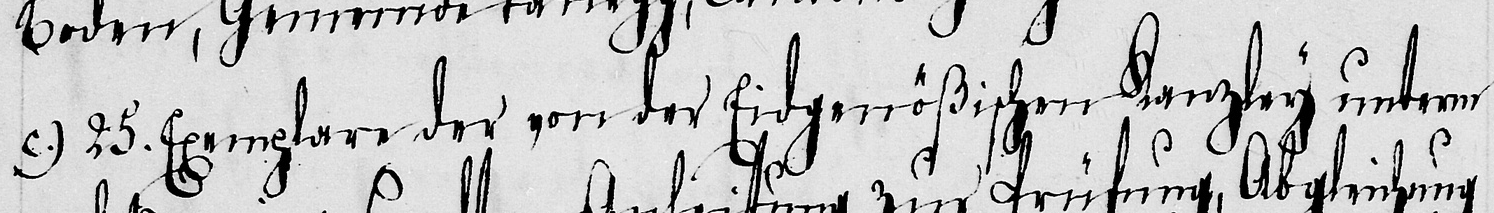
c.) 25. Exemplare der von der Eidgenößischen Kanzley unterm
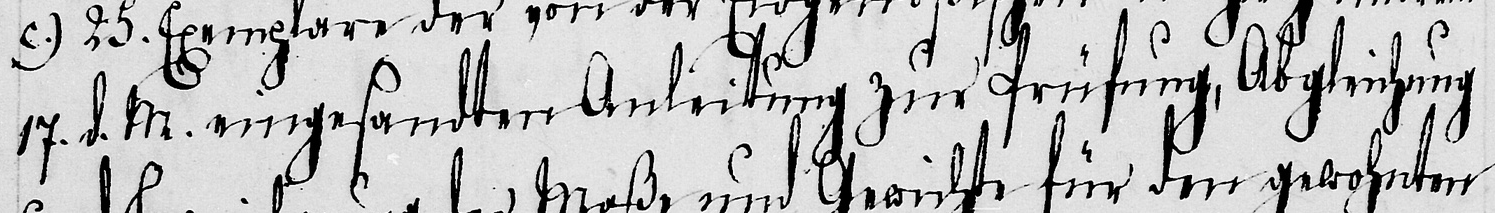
17. d. M. eingesandten Anleitung zur Prüfung, Abgleichung
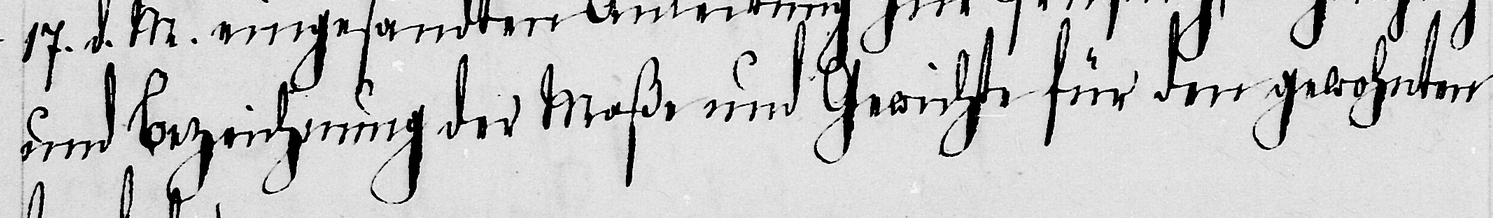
und Bezeichnung der Maße und Gewichte für den gewohnten
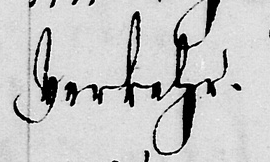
Verkehr.
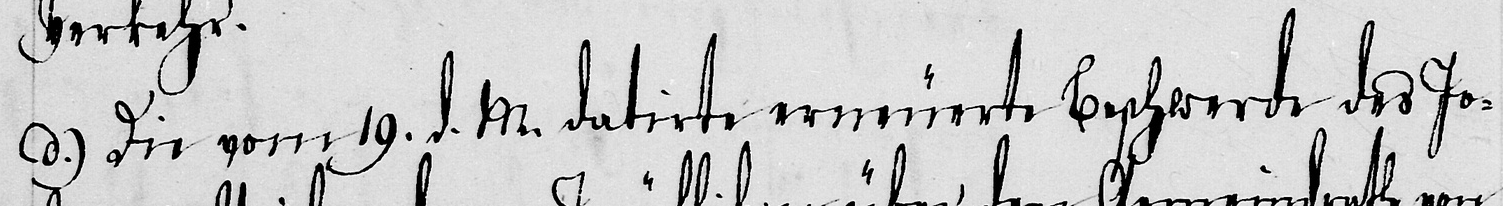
d.) Die vom 19. d. M. datirte erneuerte Beschwerde des Jo¬
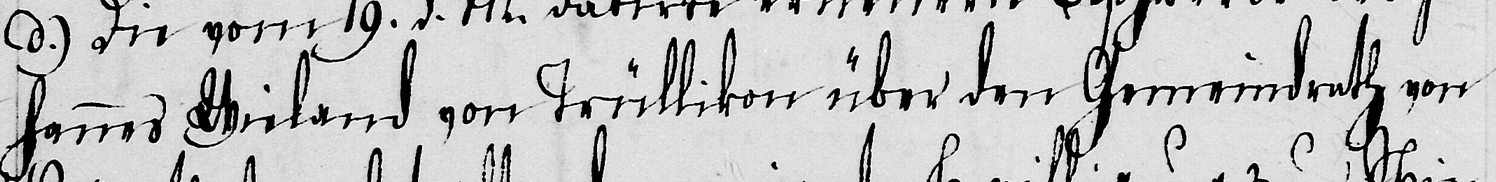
hannes Wieland von Trüllikon über den Gemeindrath von
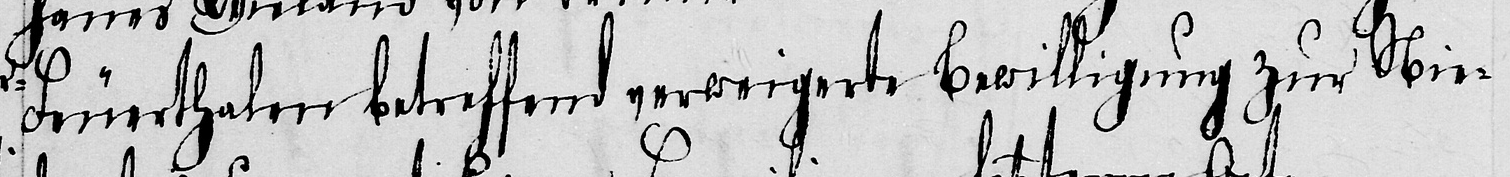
Feuerthalen betreffend verweigerte Bewilligung zur Nie¬
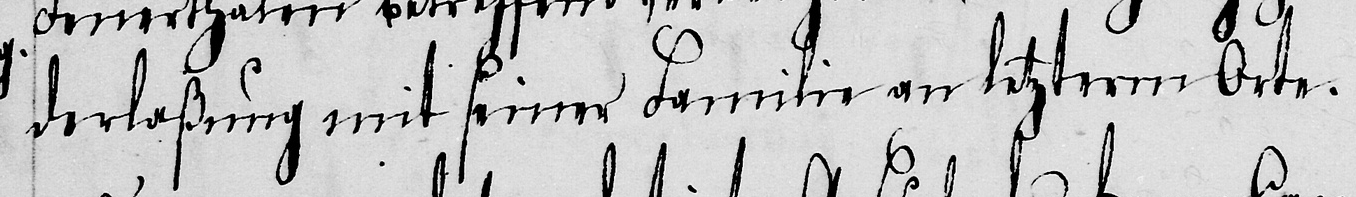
derlaßung mit seiner Familie an letzterm Orte.
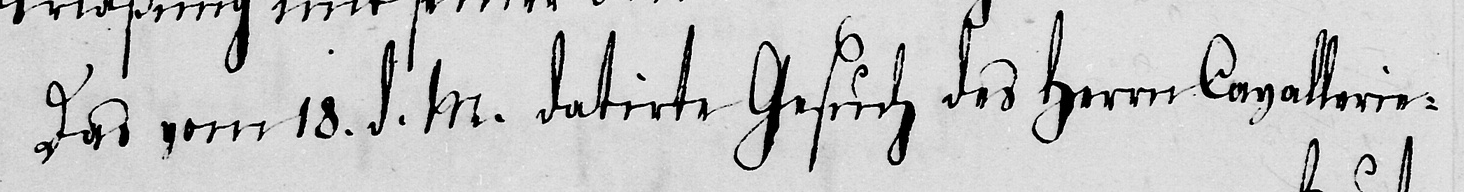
Das vom 18. d. M. datirte Gesuch des Herrn Cavalleri¬
